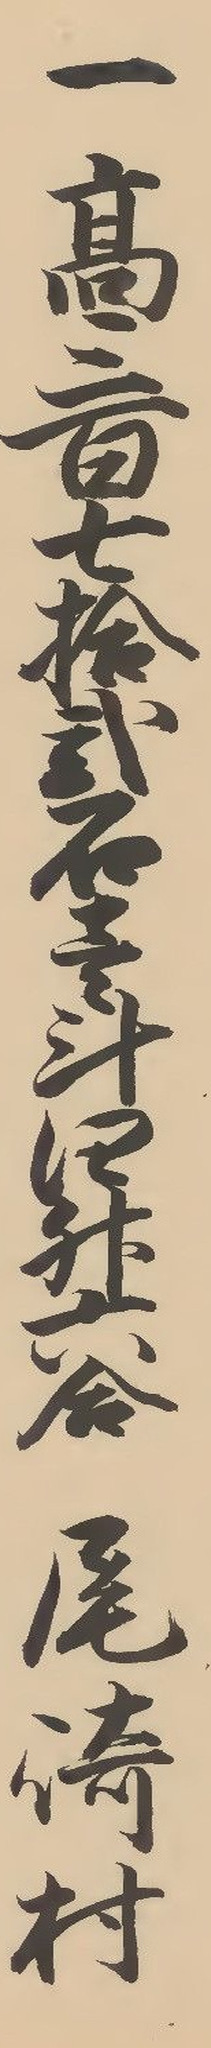一髙三百七拾弐石壱斗四升六合尾崎村
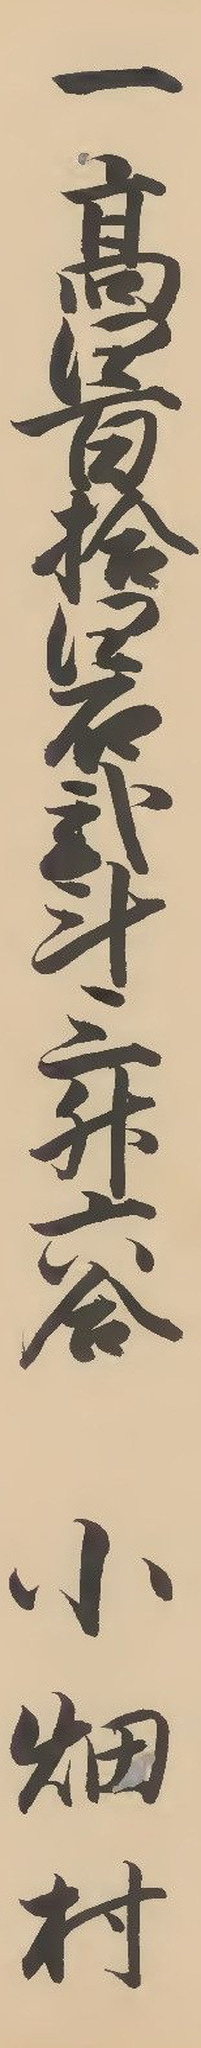一髙四百拾四石弐斗三升六合小畑村
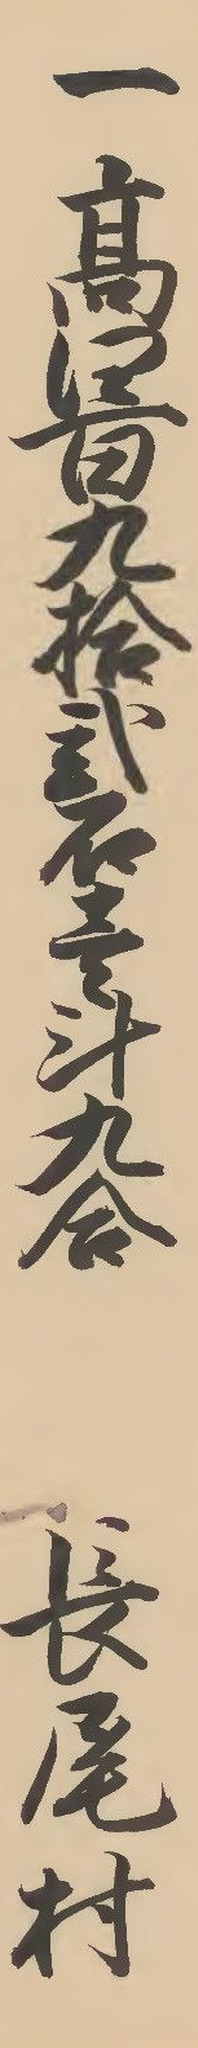一髙四百九拾弐石壱斗九合長尾村

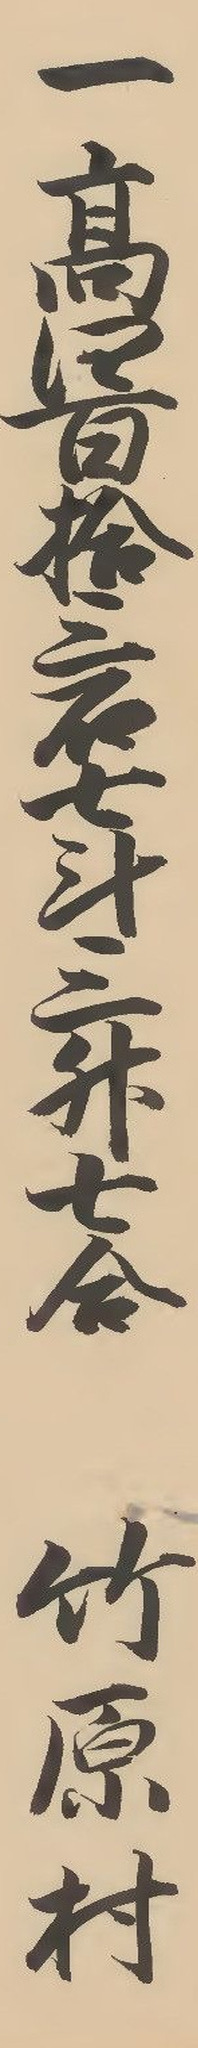一髙四百拾三石七斗三升七合竹原村
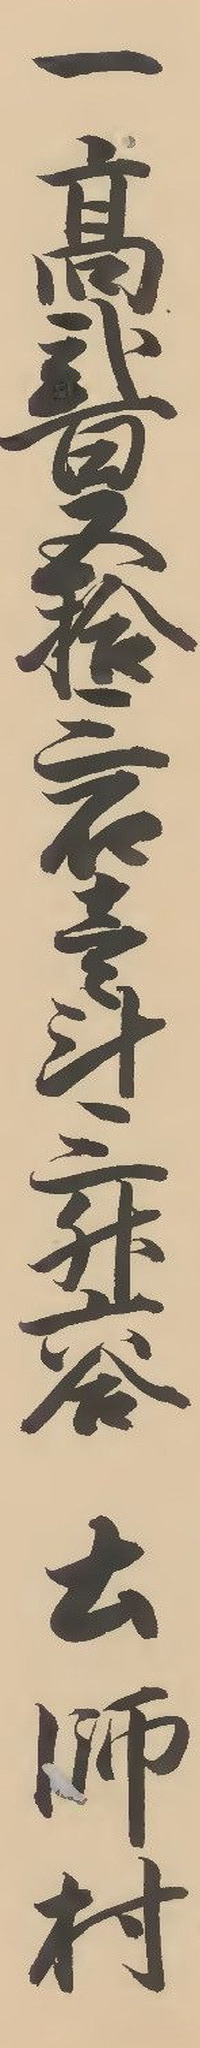一髙弐百五拾三石壱斗三升六合土師村
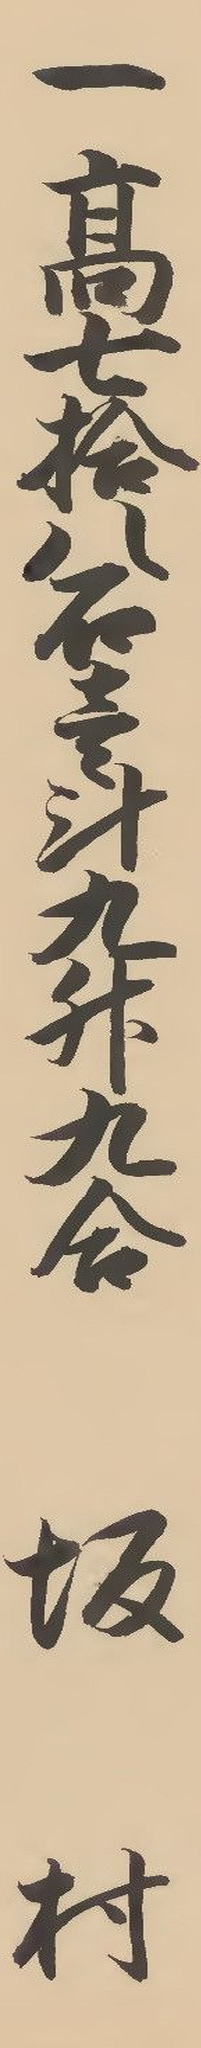一髙七拾八石壱斗九合九合坂村
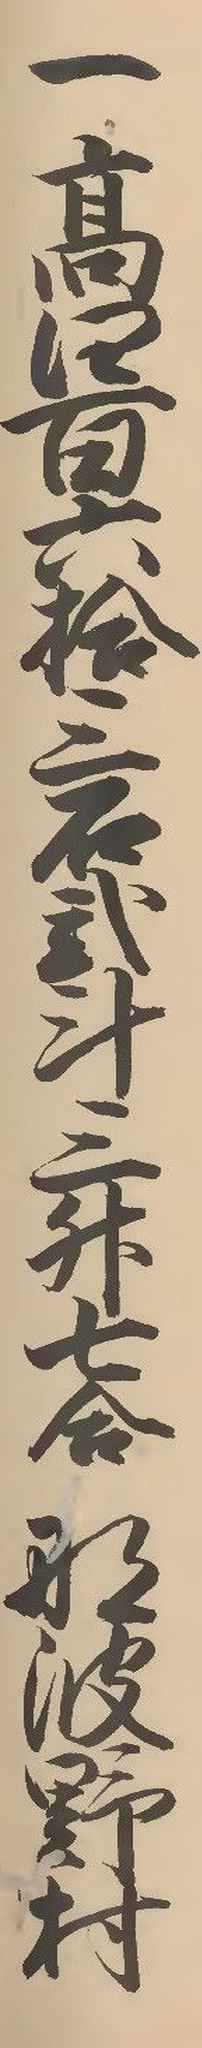一髙四百六拾三石弐斗三升七合那波野村
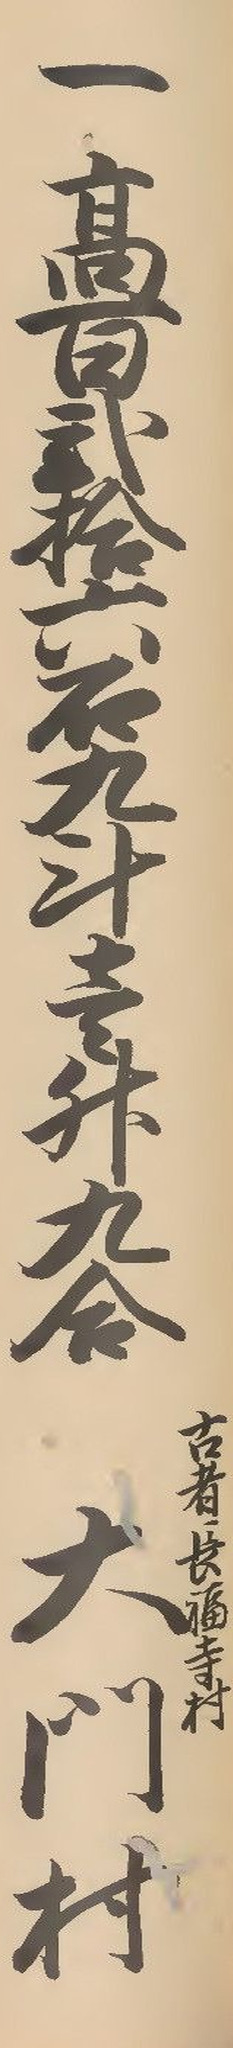一髙百弐拾六石九斗壱升九合大門村
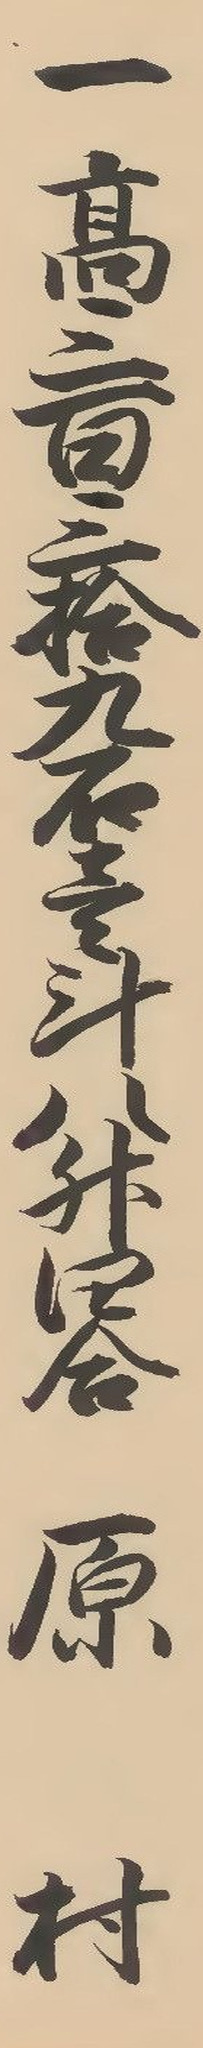一髙三百三拾九石壱斗八升四合原村
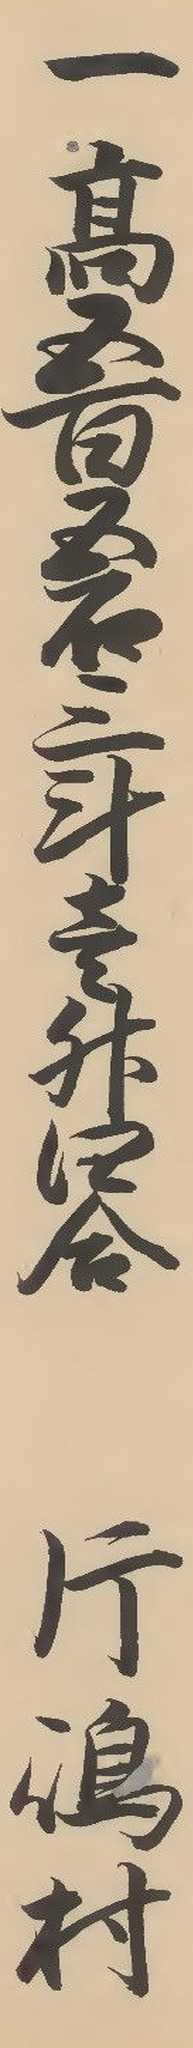一髙五百五石三斗壱升四合片嶋村
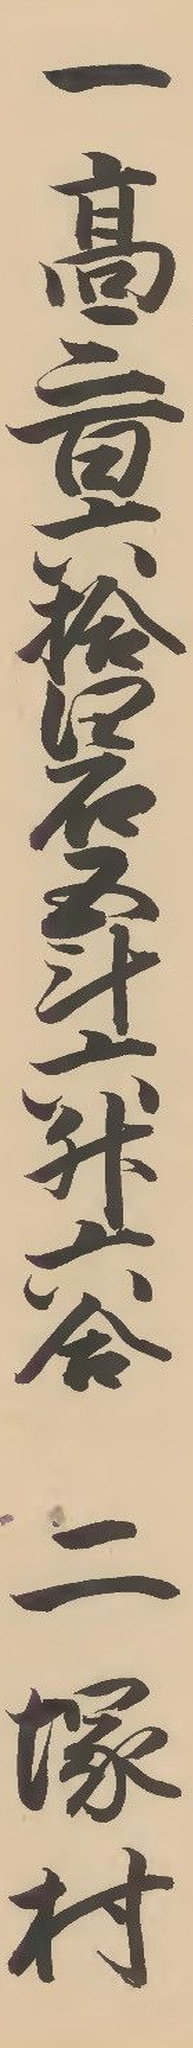一髙三百六拾四石五斗六升六合二塚村

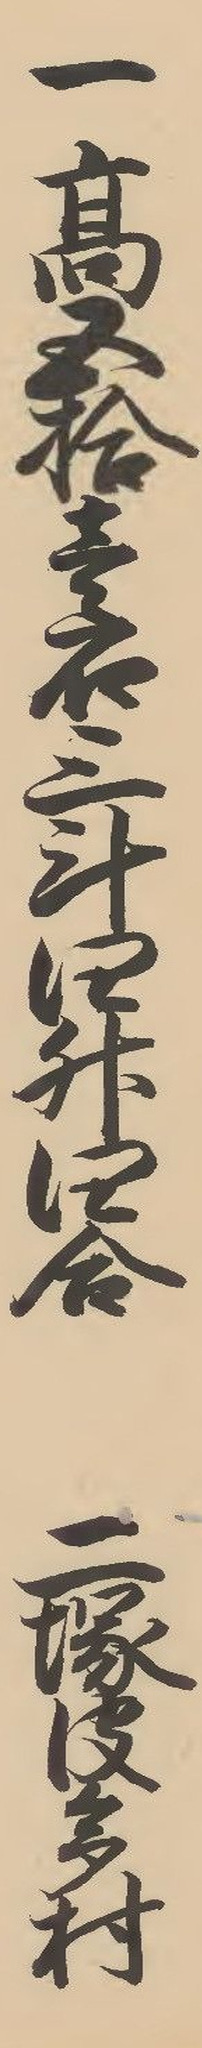一髙五拾壱石三斗四升四合二塚皮多村
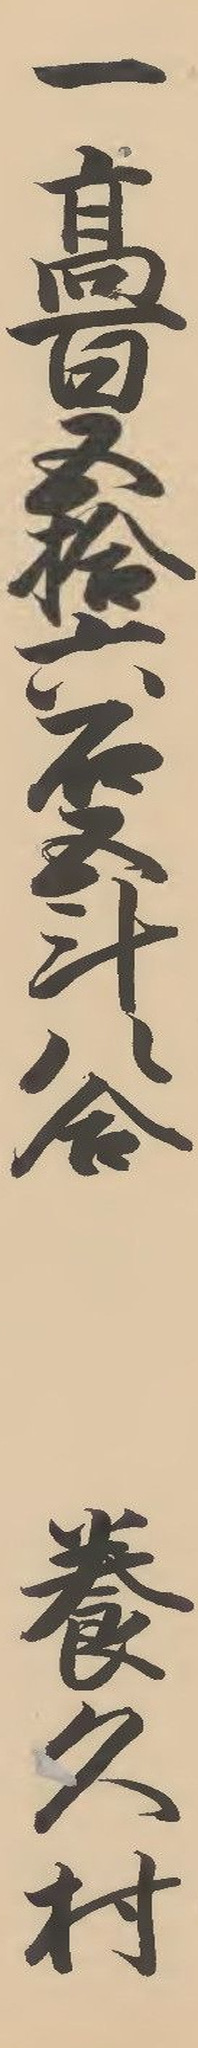一髙百五拾六石五斗八合養久村
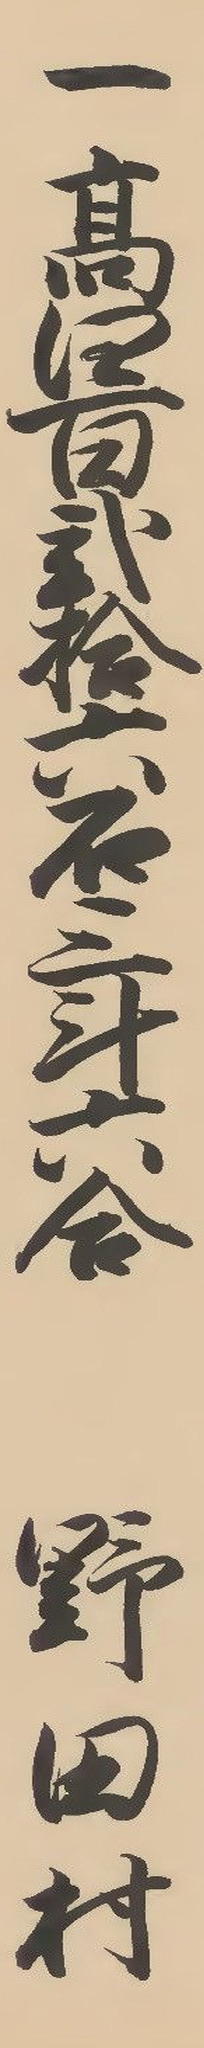一髙四百弐拾六石三斗六合野田村
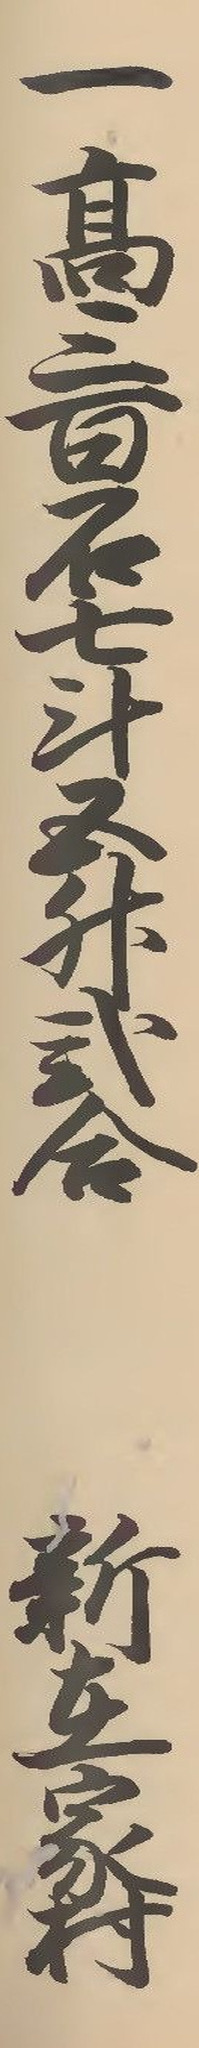一髙三百石七斗五升弐合新在家村
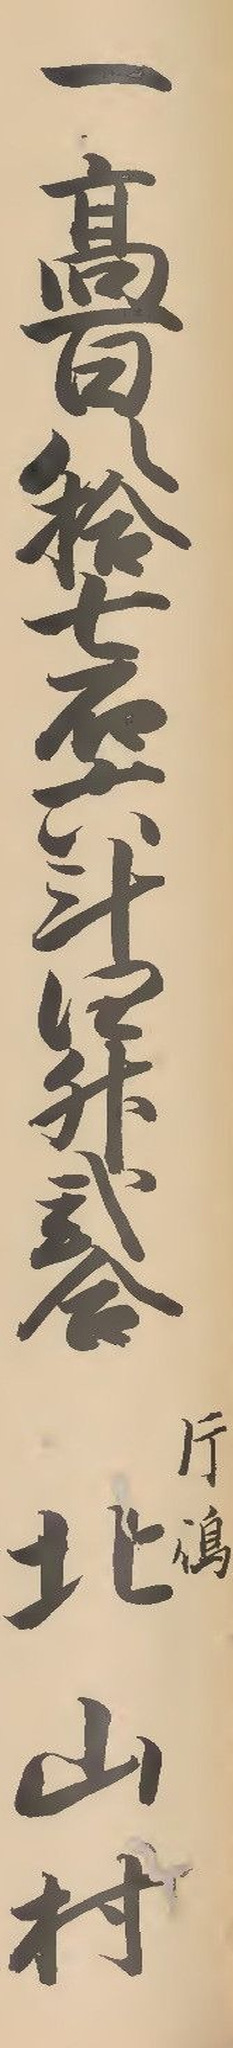一髙百八拾七石六斗四升弐合北山村
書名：播磨国郷帳
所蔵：国立公文書館 National Archives of Japan
